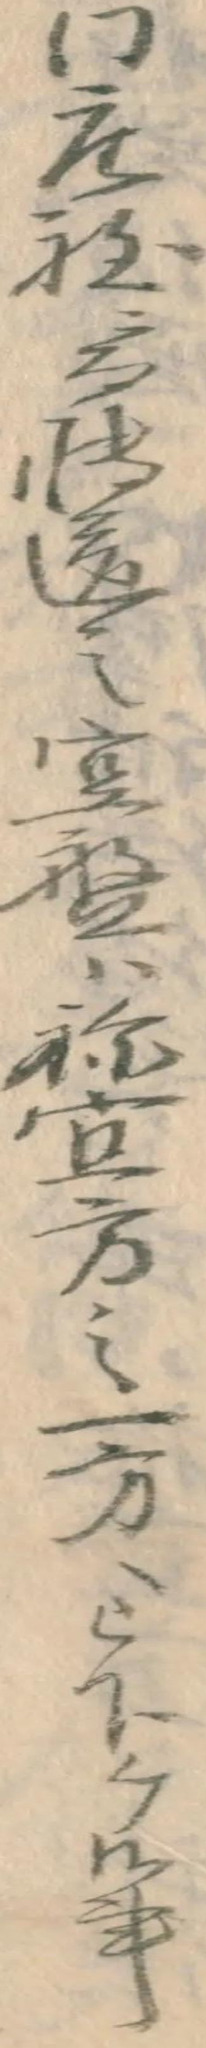同座程ニ而轉道之空盤ハ祢宜方之一方へ被下ケ候事
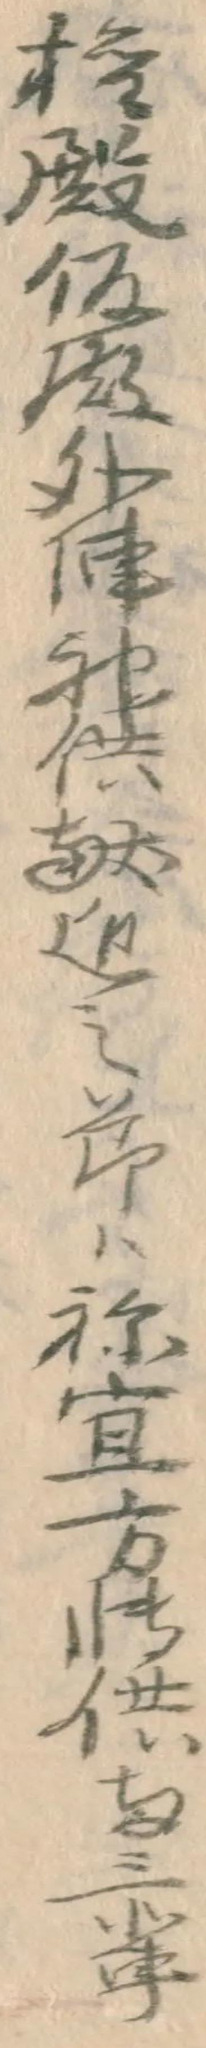権殿仮殿外神供献進之節ハ祢宜方轉供両三輩
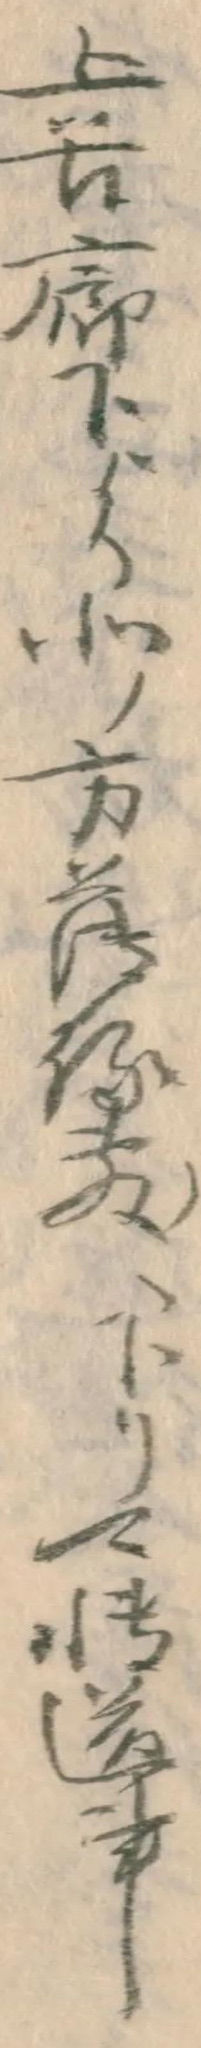上首廊下より北ノ方薄縁敷へ下り可轉送事
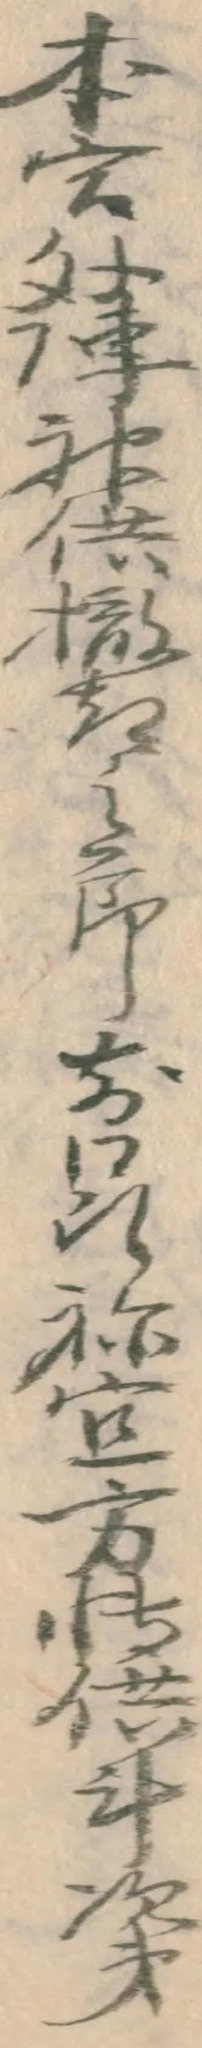本宮外神供撒却之節前同断称宜方轉供斗次第
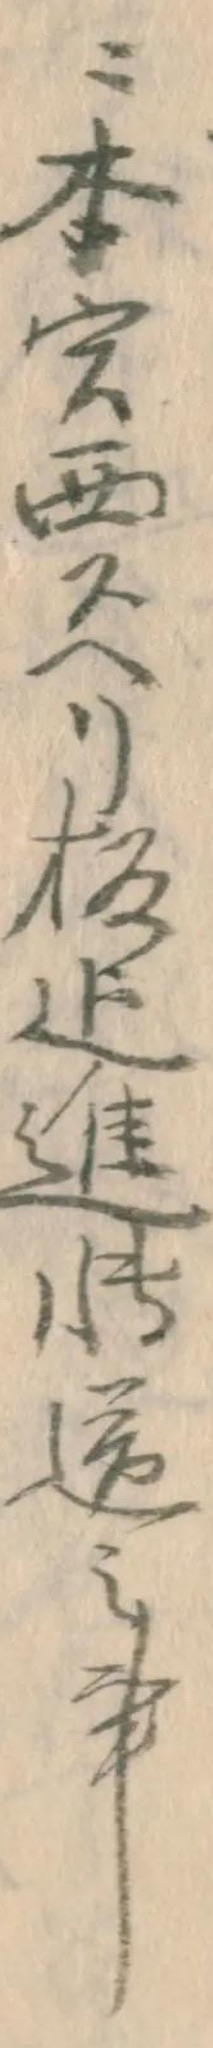ニ本宮西スヘリ板迄進轉送之事
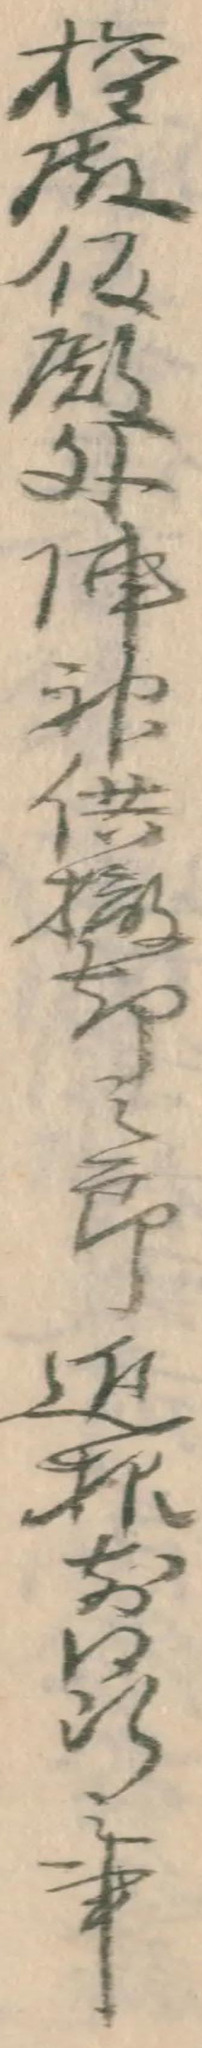権殿仮殿外陣神供撒却之節近様前同断之事
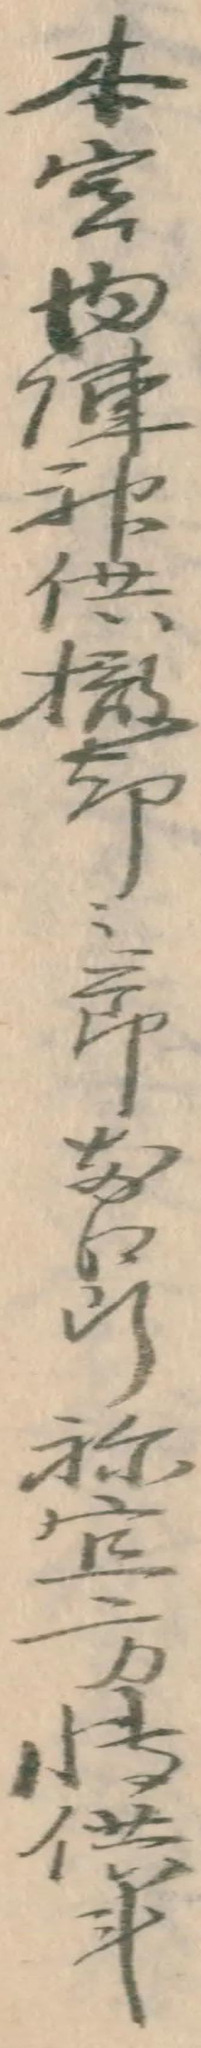本宮内陣神供撒却之節前同断祢宜方轉供斗
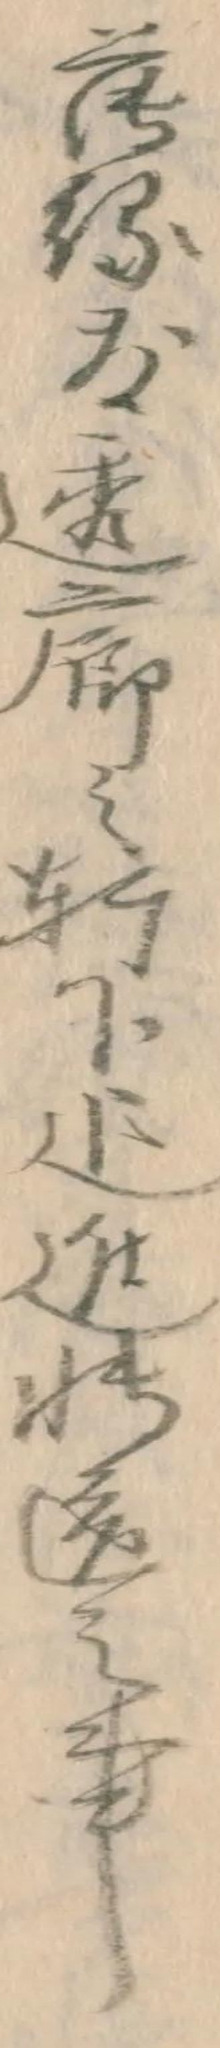落縁敷透廊之軒下迄進轉送之事
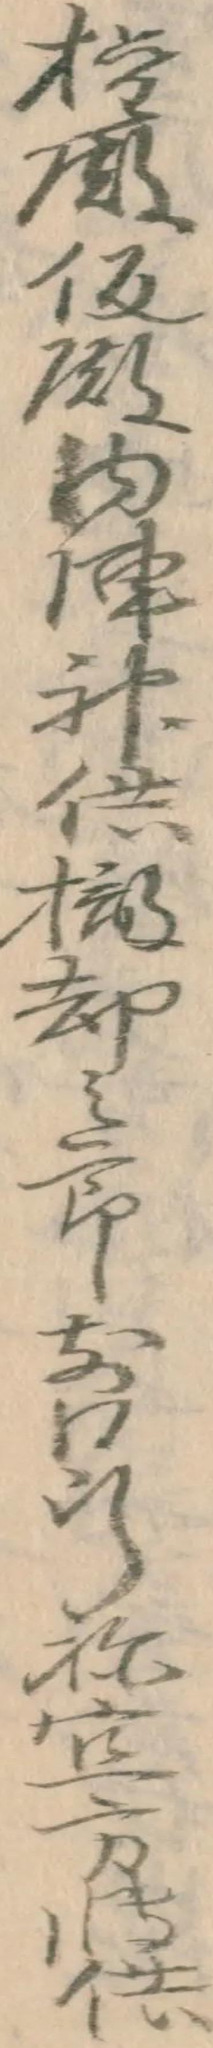権殿仮殿内陣神供撤却之節前同断称宜方轉供
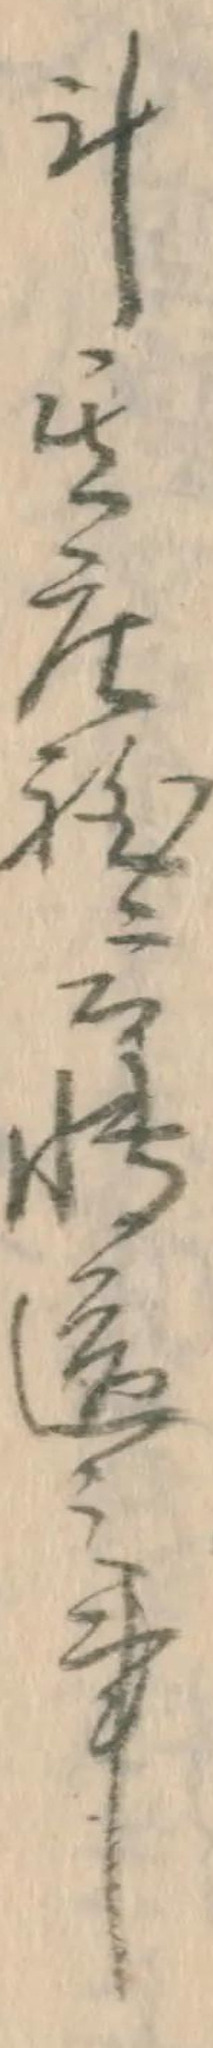斗其座程ニ而轉送之事
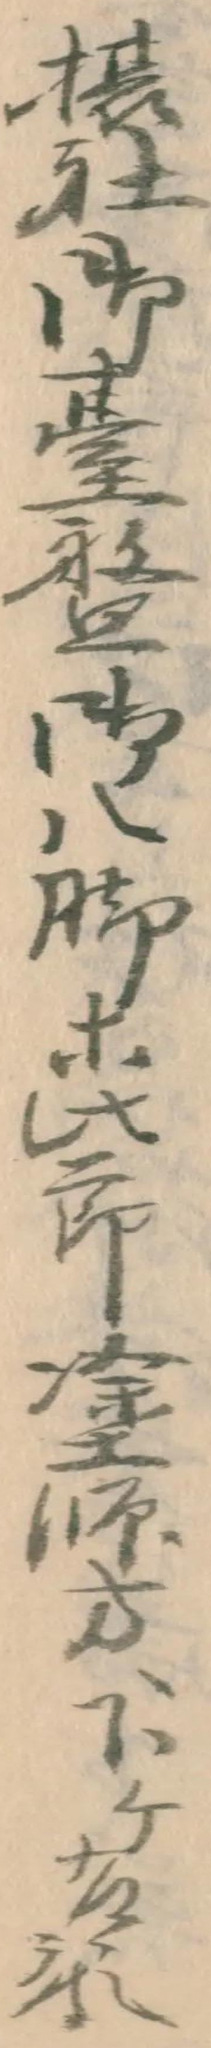摂社御臺盤御八脚等此節塗師方へ下ケ有之
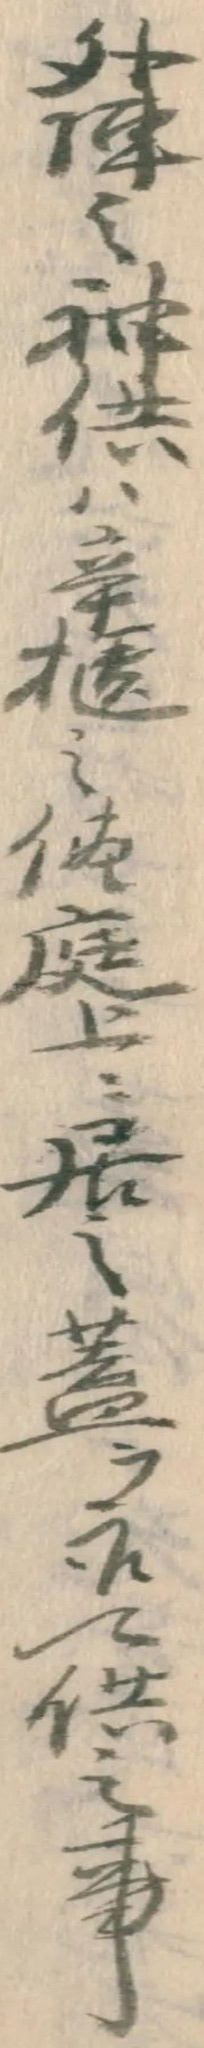外陣之神供ハ辛櫃之侭庭上に居之蓋ヲ取可供之事
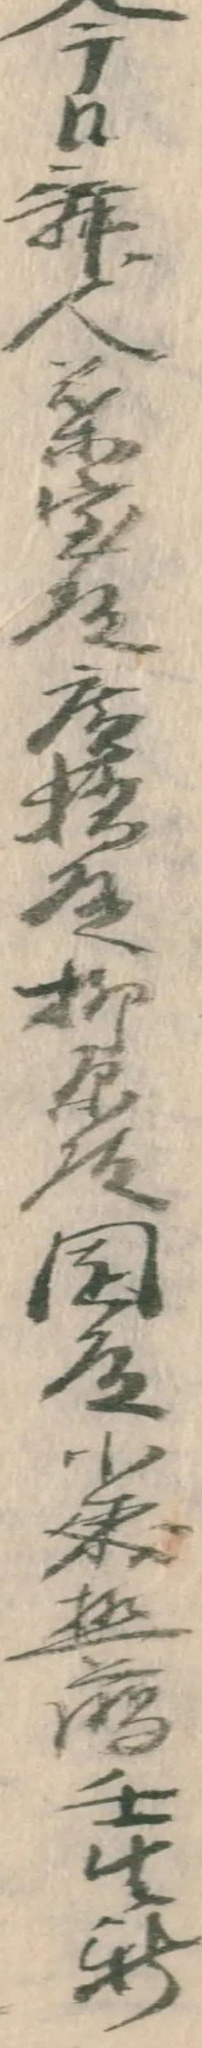今日舞人葉室殿廣橋殿柳原殿園殿小森惣臈壬生新
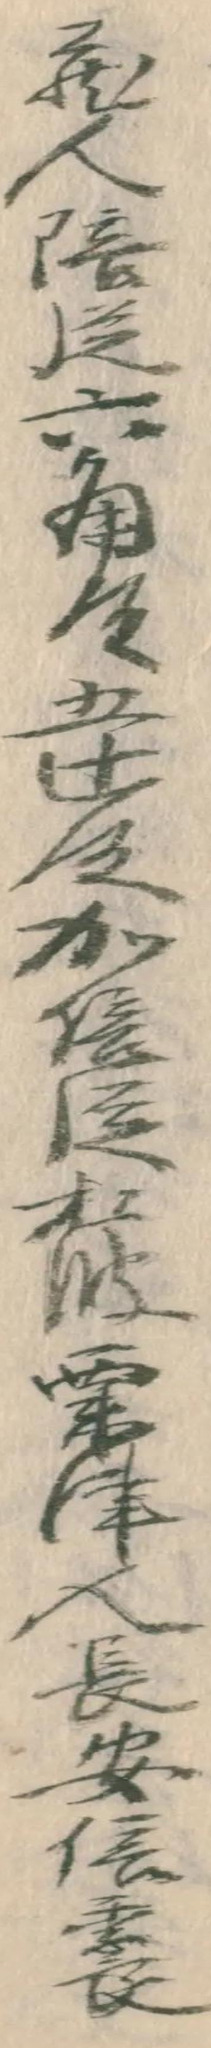蔵人陪従六角殿五辻殿加侍従松波粟津人長安倍季長
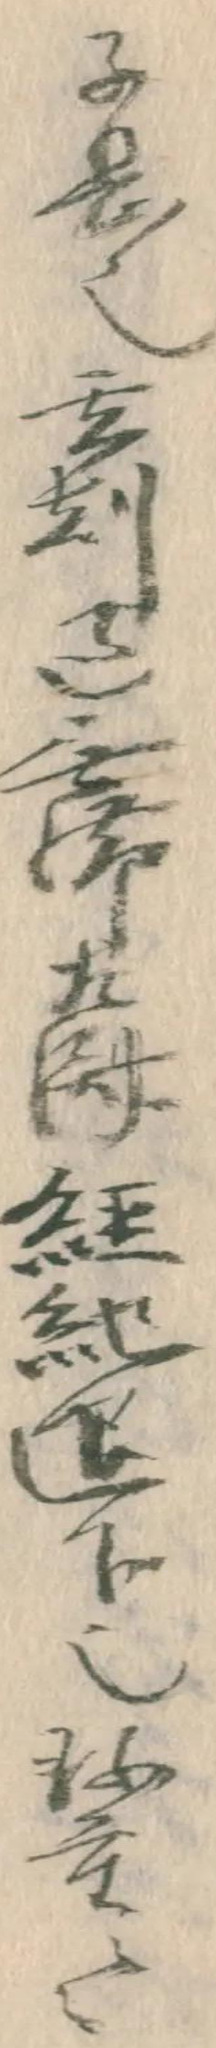子息也亥刻過無滞相済経紀退下之珍重々々
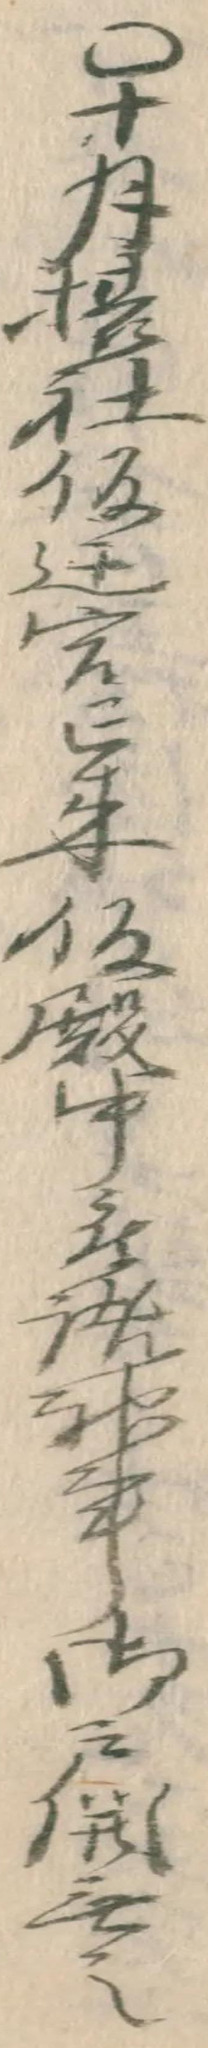○十月摂社仮遷宮已来仮殿中ニ付神事御戸開無之
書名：賀茂社記録. 第66冊
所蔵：国立国会図書館 National Diet Library, JAPAN
